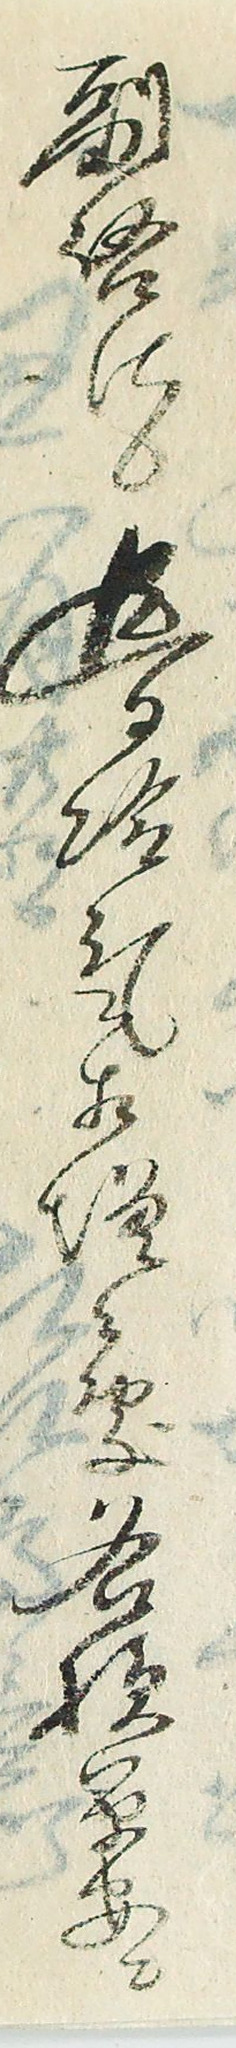副啓仕候追日冷気相増候処各様御平安に
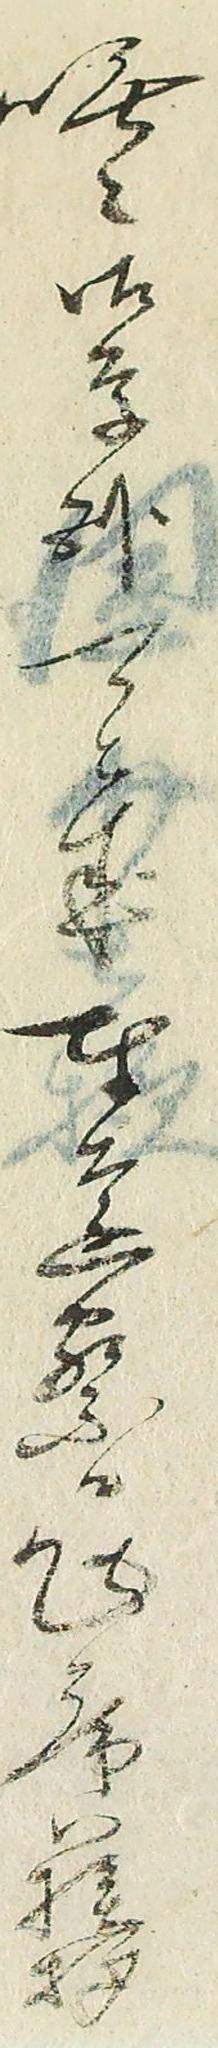嘸々御草臥可被成奉遠察候乍序御挨拶
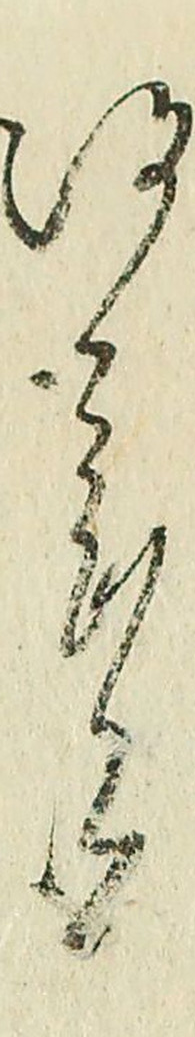得御意候以上
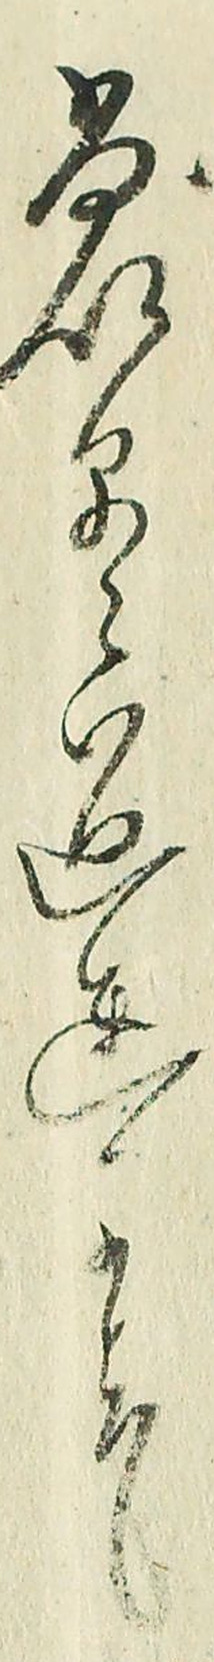尚以早々御廻達可被下候
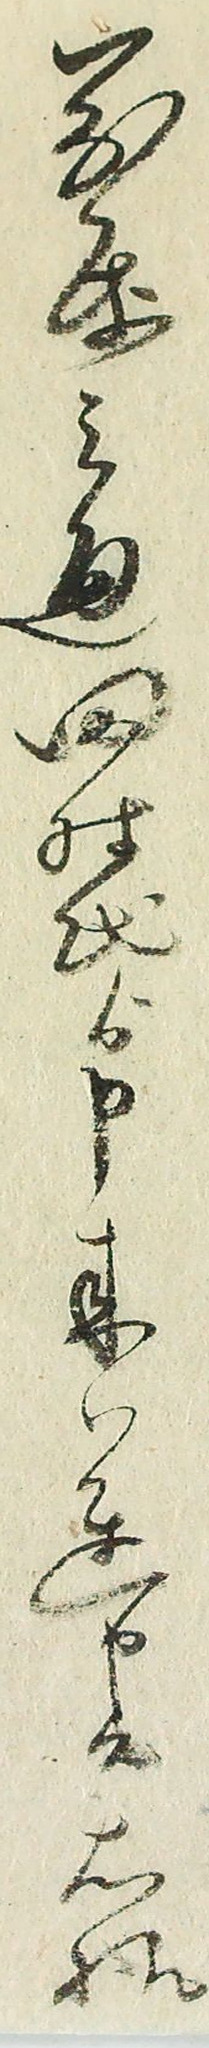別紙之通田村氏ゟ申来御達申候右様
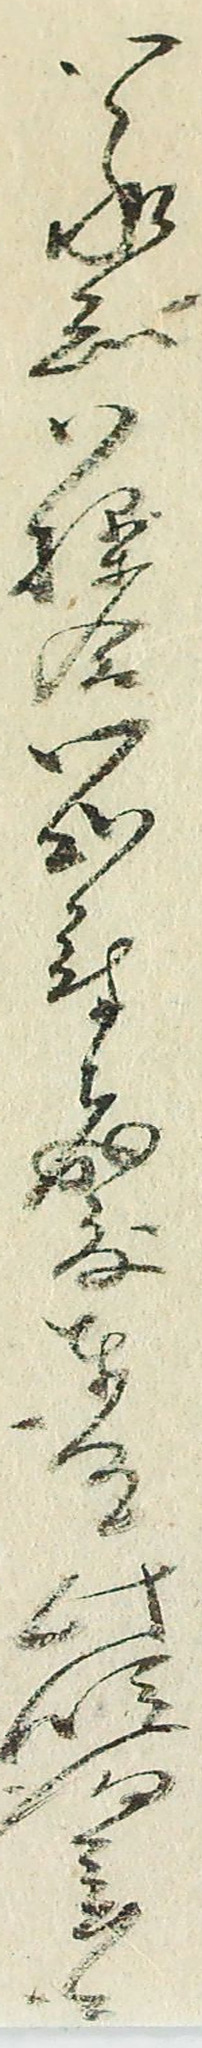御承知御操合御出座被成度奉存候此段得御意候
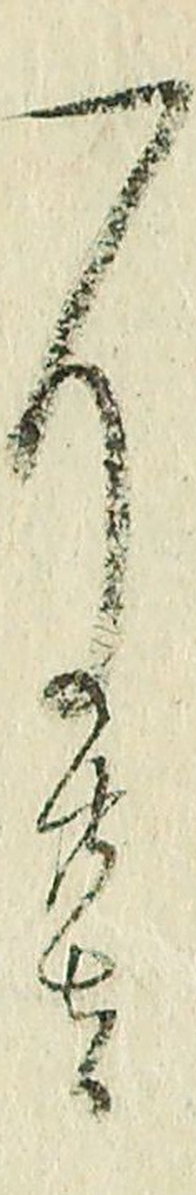八月廿七日
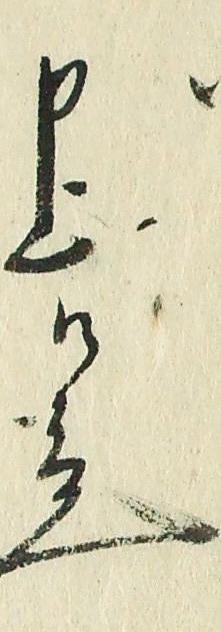申上候覚
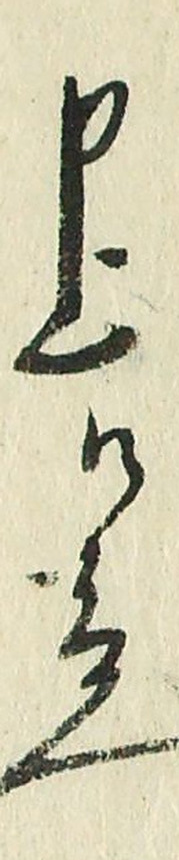申上候覚
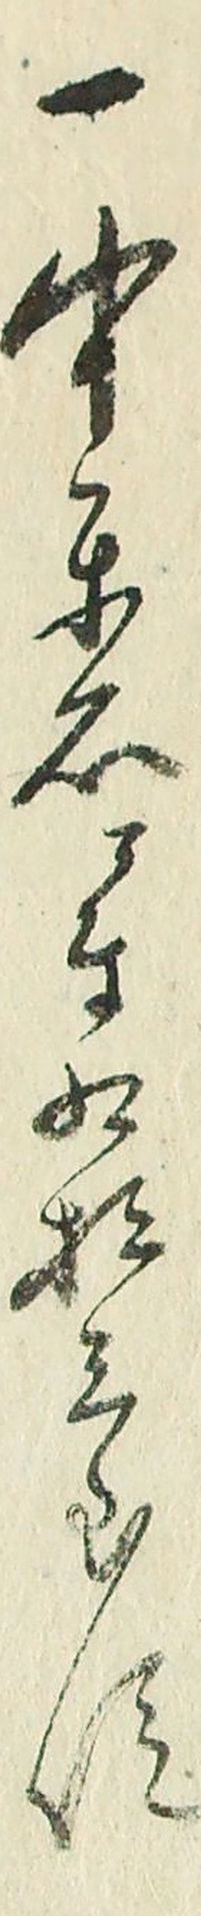一中米石に付九拾三匁位
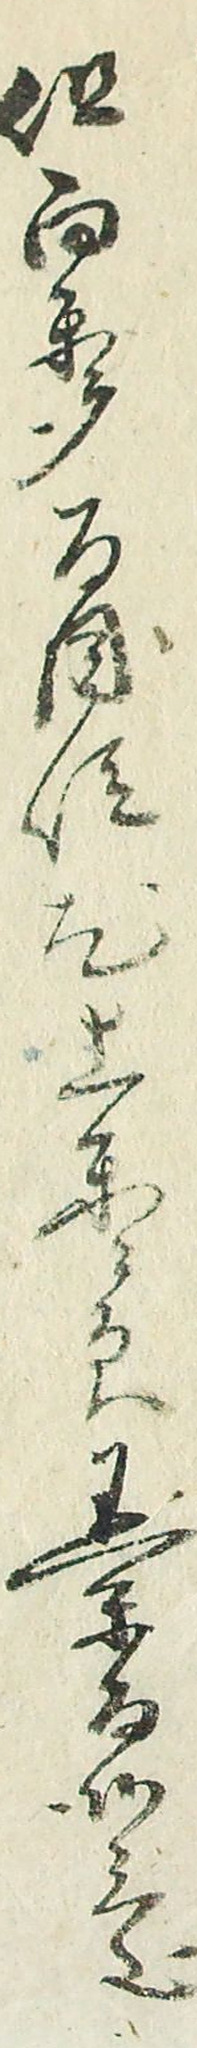但白米にして百目位尤上米にては黒米百弐三匁
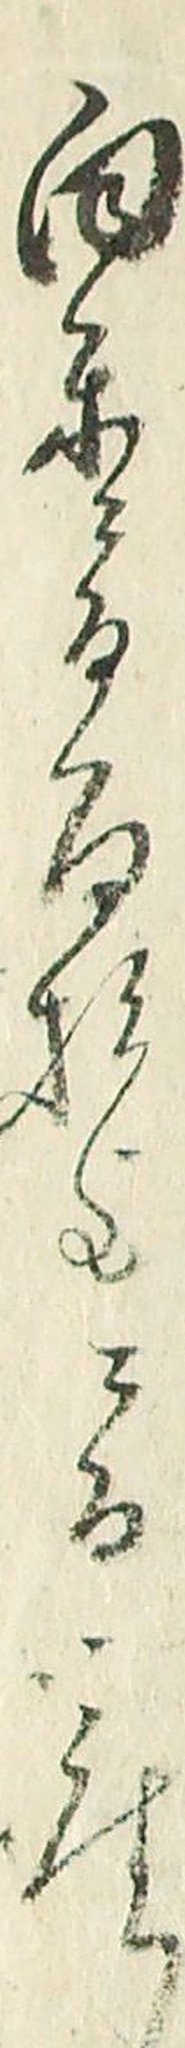白米にて百拾匁にて御座候

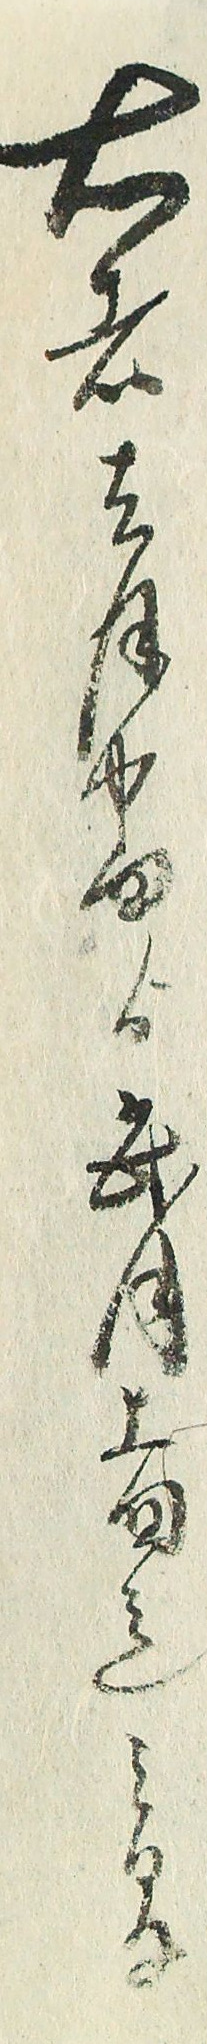右は去月中旬ゟ当月上旬迄之間
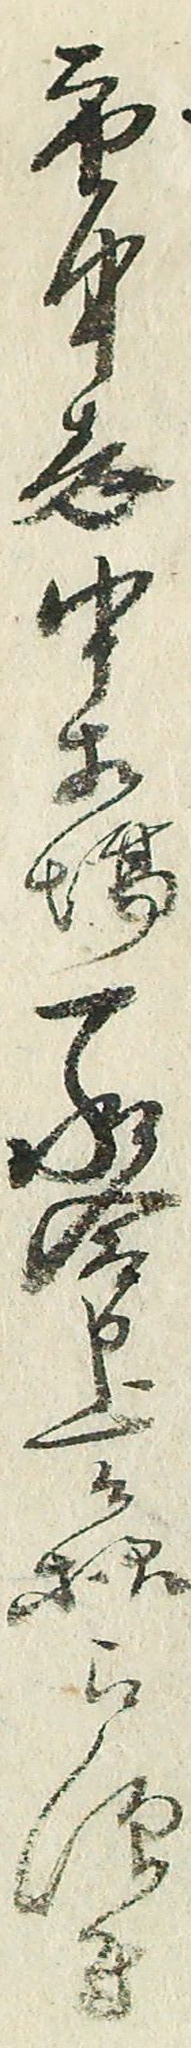市中表中相場承合申上候様被仰付
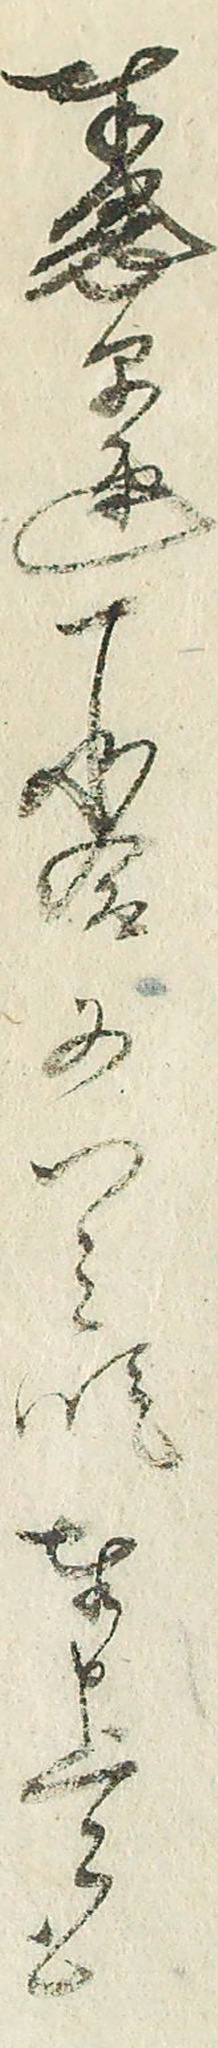奉畏早速承合右之段奉申上候以上
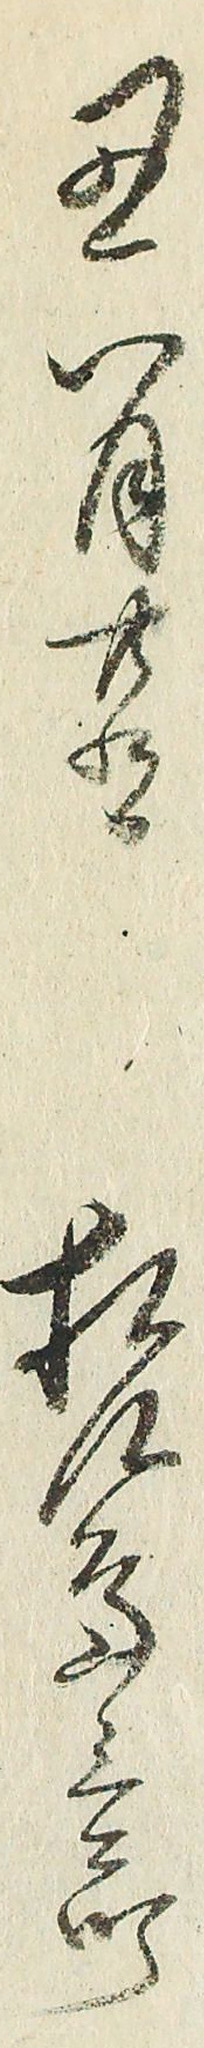丑八月廿九日松江島三郎
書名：公辺御役人為御廻浦御立越諸御用一巻
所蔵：鳴門教育大学 Naruto University of Education
